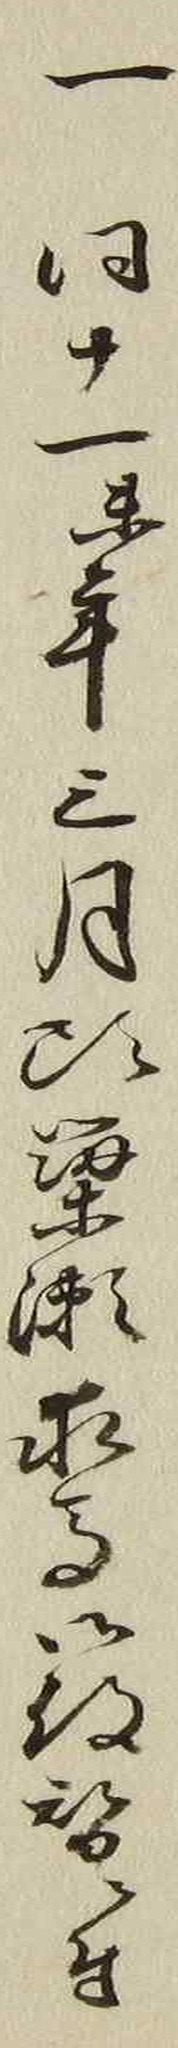一同十一未年三月頭簗瀬求馬御役替ニ付
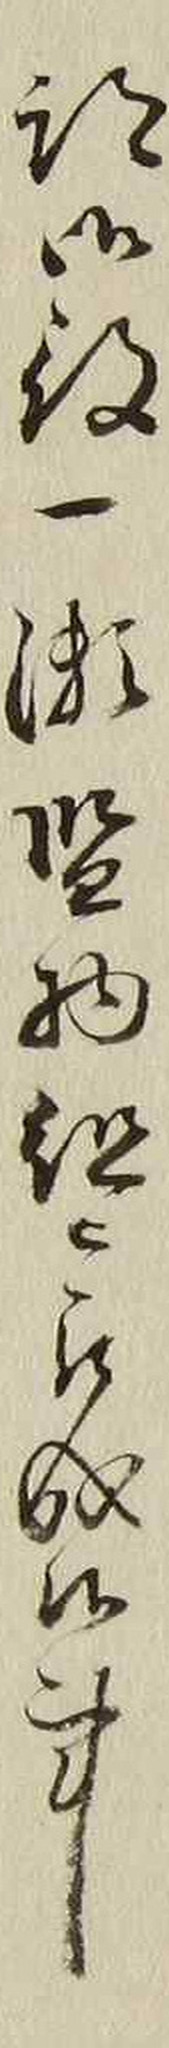跡御役一瀬監物組ニ罷成候事
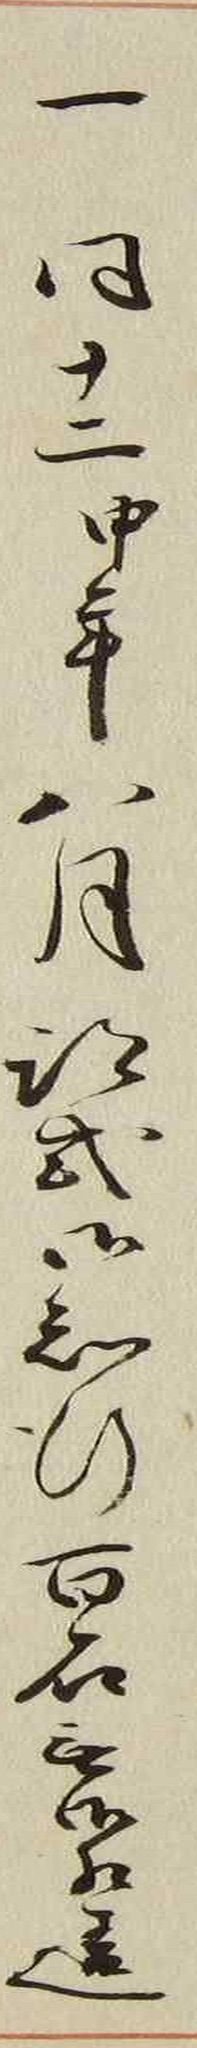一同十二申年八月跡式御知行百石無御相違
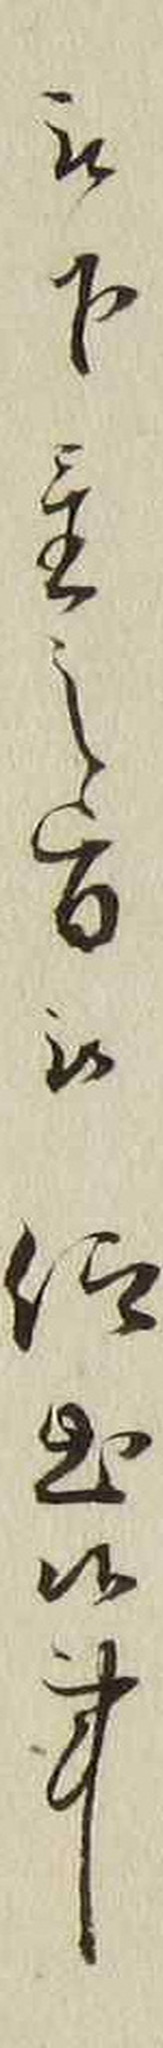被下置之旨被仰出候事
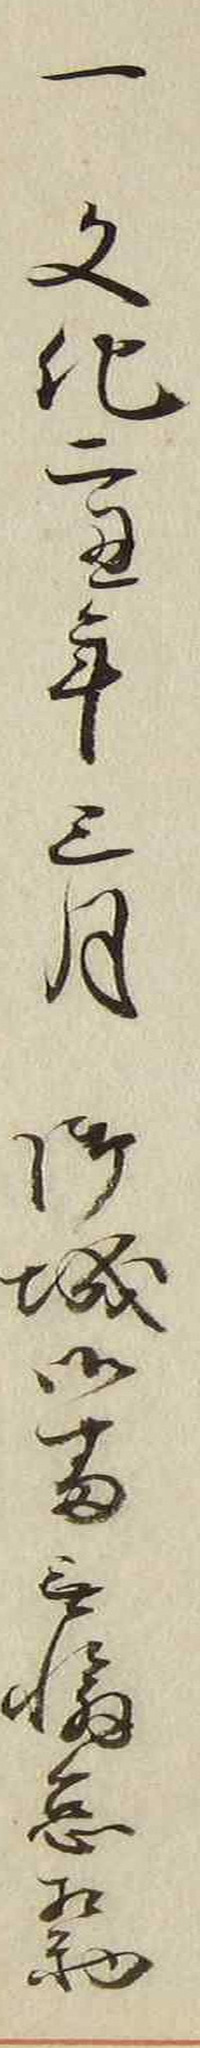一文化二丑年三月御城御番無懈怠相勤
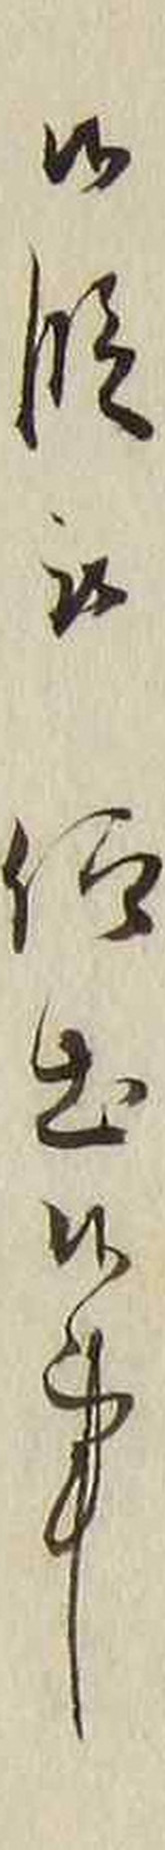候段被仰出候事

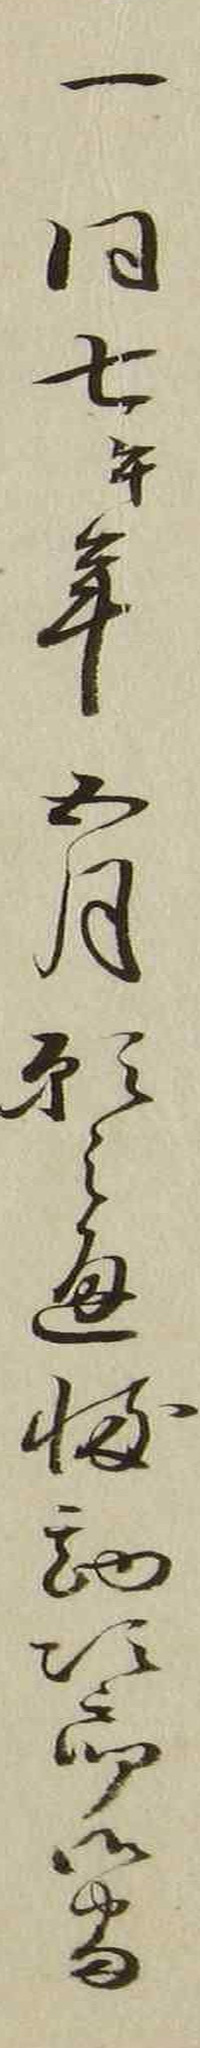一同七午年五月願之通忰勘次郎御番
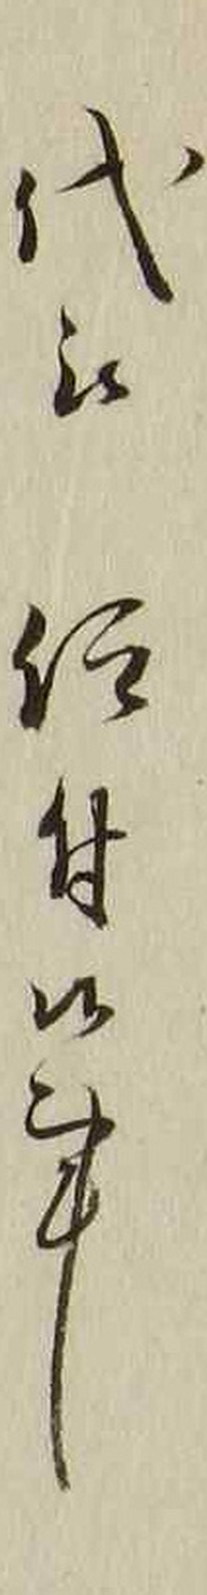代被仰付候事
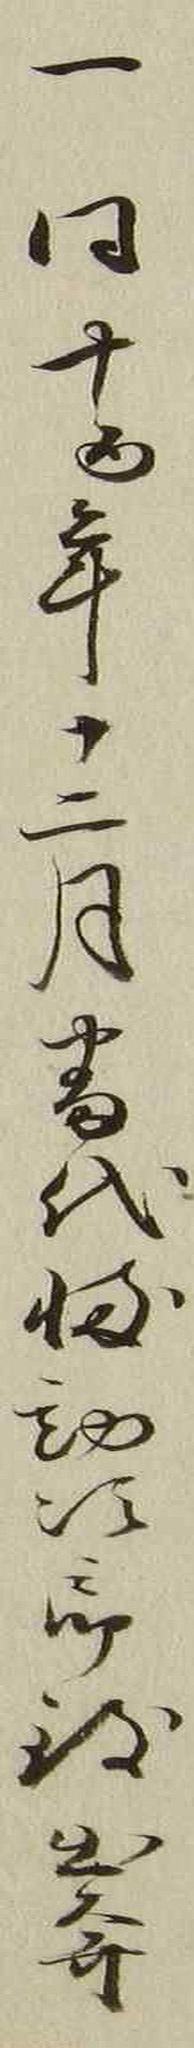一同十酉年十二月番代忰勘次郎致出奔
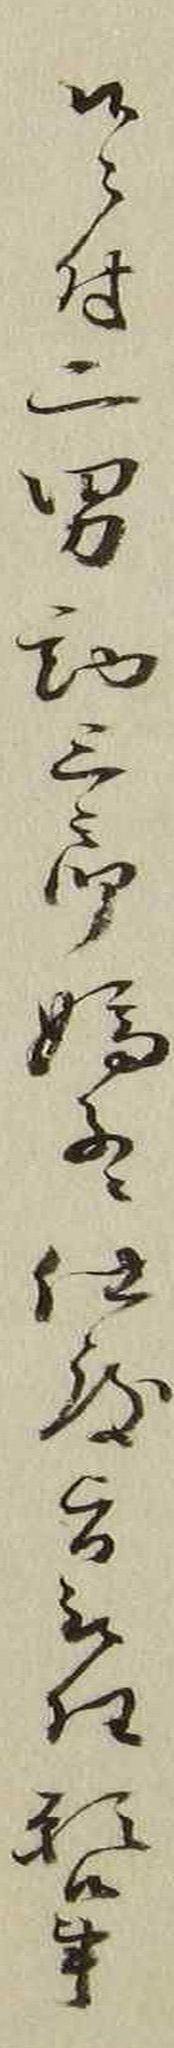候ニ付二男勘三郎嫡子ニ仕度旨被任願候事
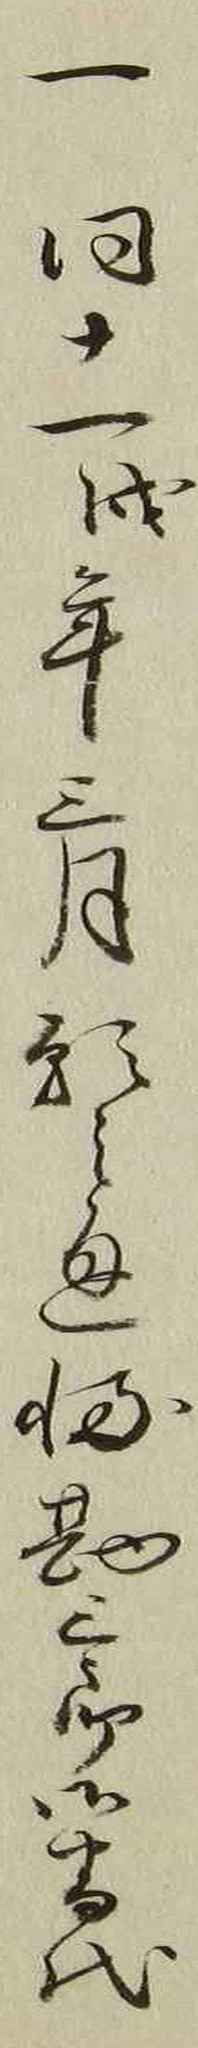一同十一戌年三月願之通忰勘三郎御番代
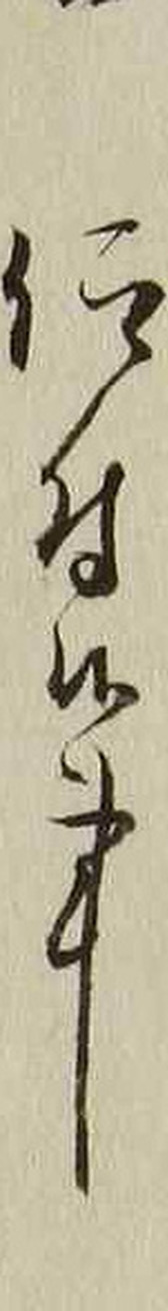被仰付候事
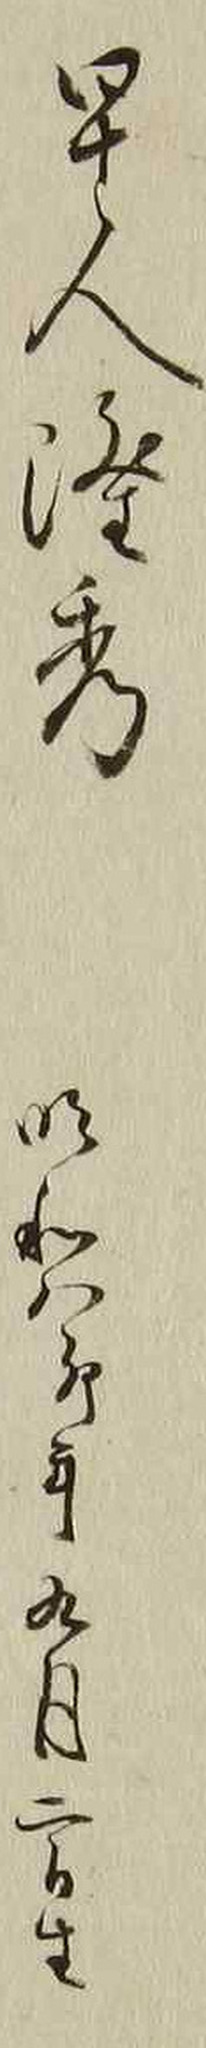早人隆秀明和八卯年九月二日生
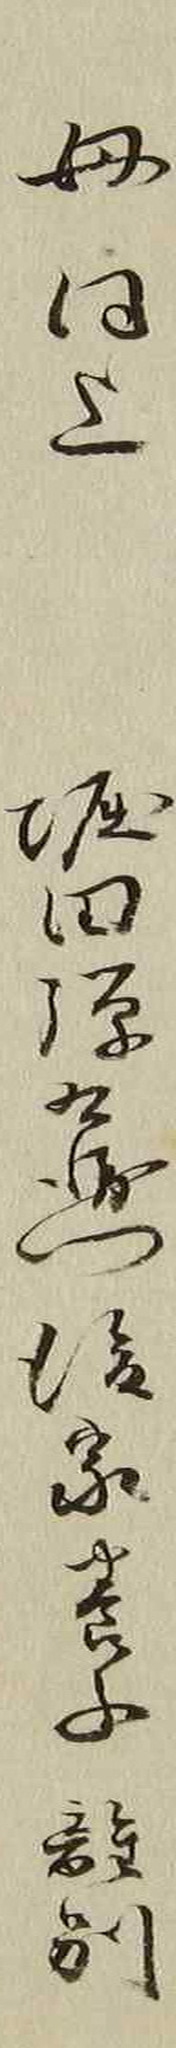母同上堀田源右衛門後家養子離別
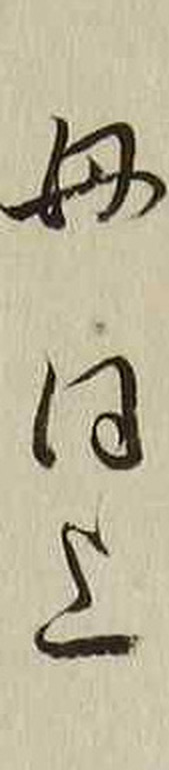母同上
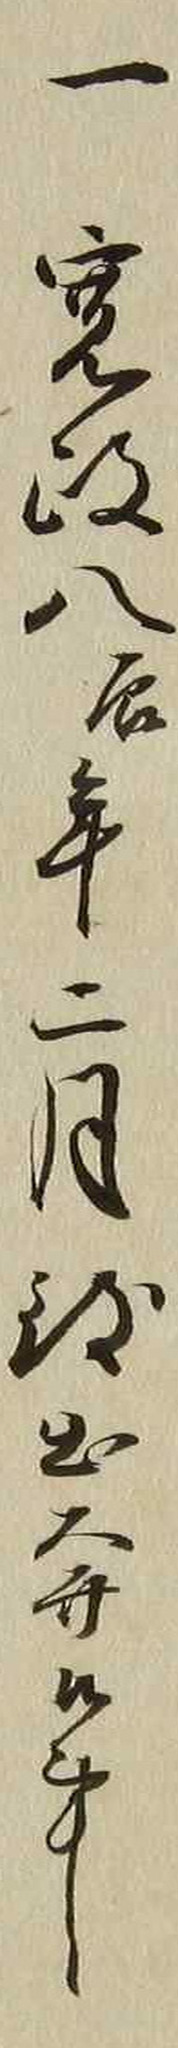一寛政八辰年二月致出奔候事
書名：諸士系譜　巻之26　い之部26
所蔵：会津若松市立会津図書館
